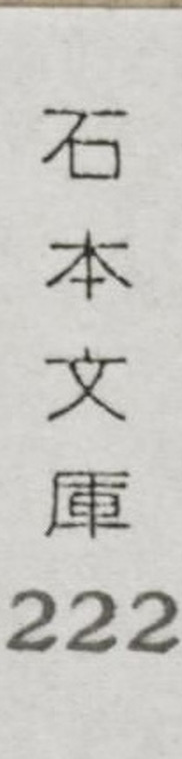石本文庫
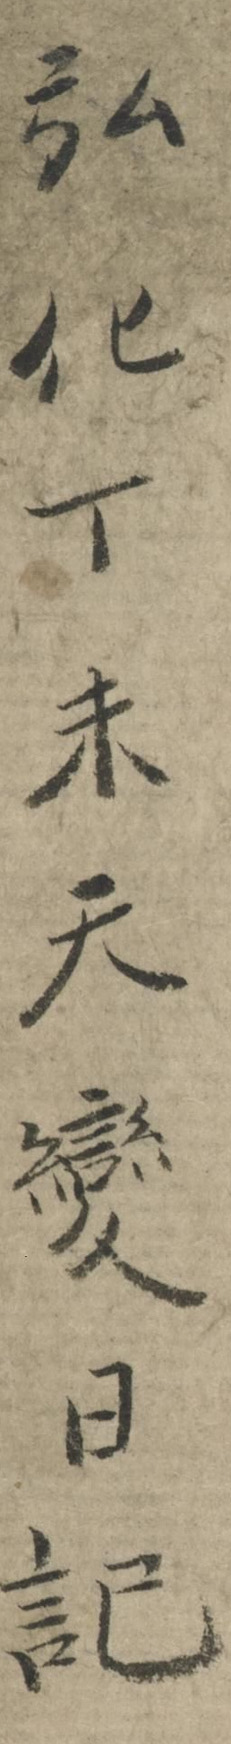弘化丁未天変日記

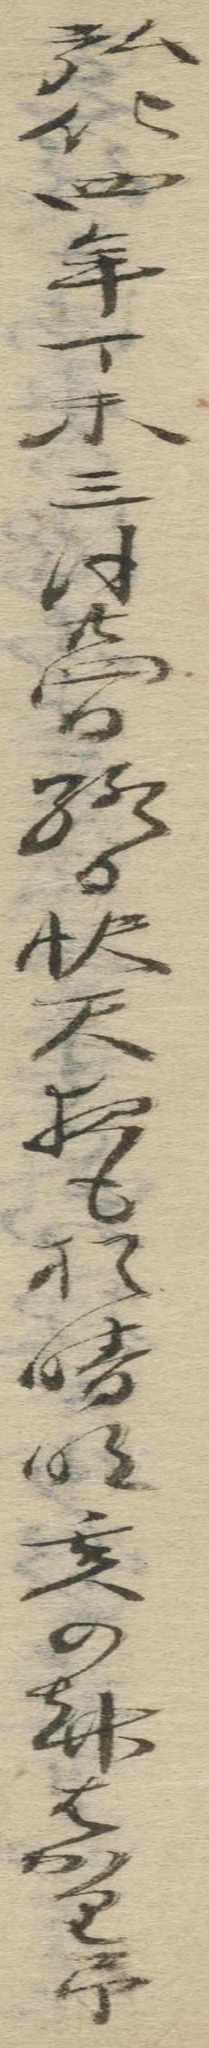弘化四年丁未三月廿四日終日快天夜も猶晴明亥の刻はかり予
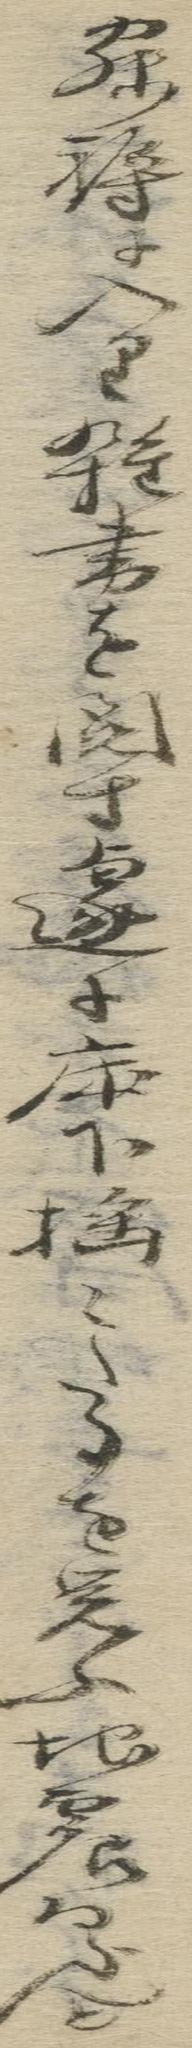寝褥に入り雑書を閲す処に床下揺々たるを覚ふ地震ならんと
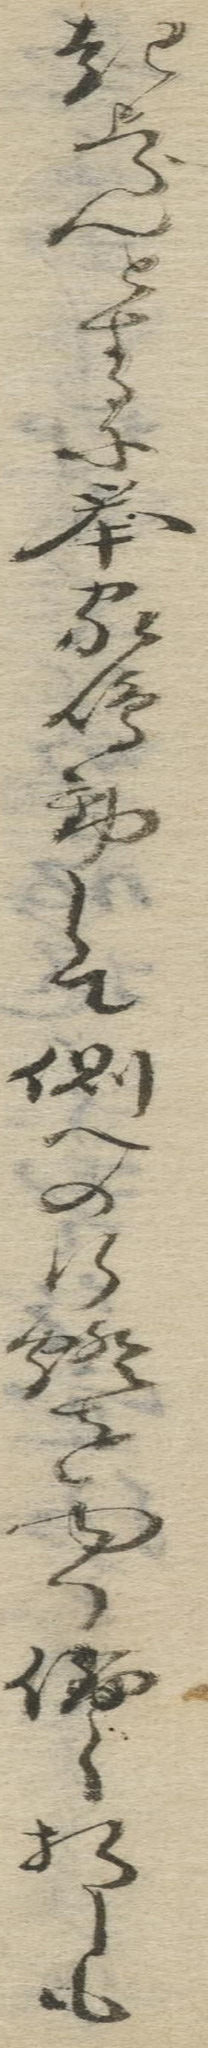起上らんとするに挙家鳴動して側への行燈をゆり倒し折しも
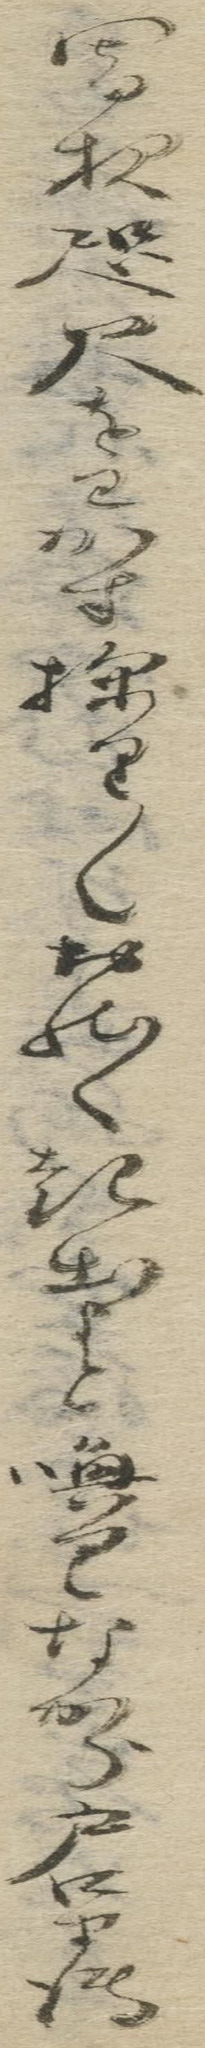闇夜咫尺をわかす探り〳〵おの〳〵起出よと喚きなから戸口に伝
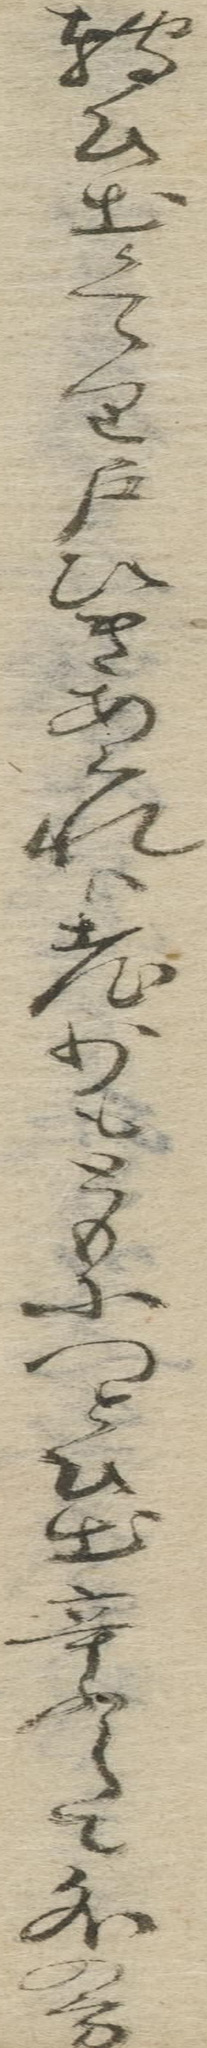轉ひ出くゝり戸ひきあくれハ老少とともにつとひ出辛ふして外の方
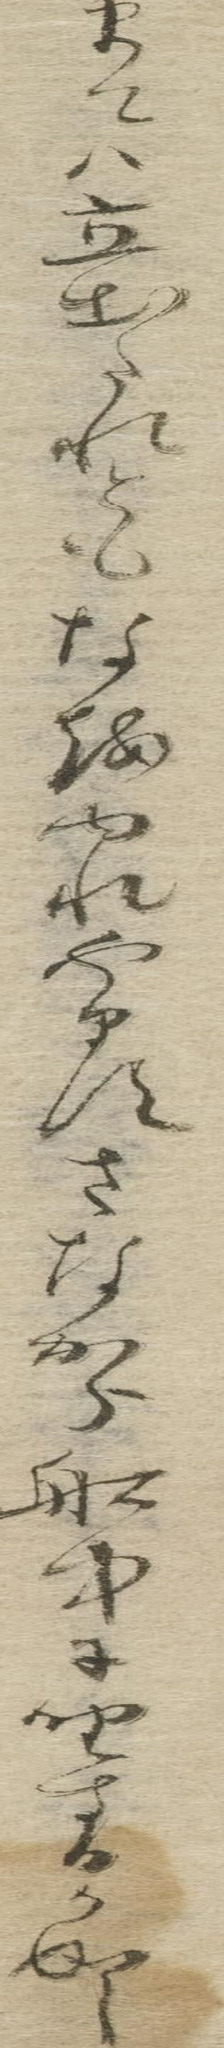まてハ立出たれともなをゆれやますさなから船中に坐するか如し
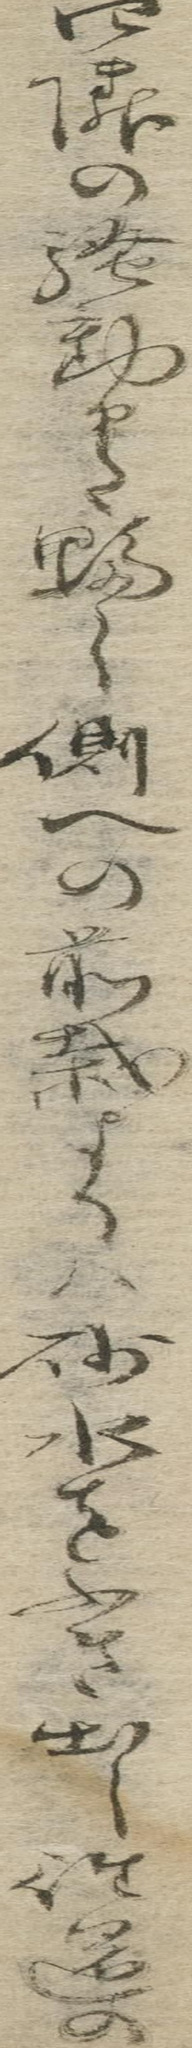四隣の騒動また夥し側への前栽よりハ砂水をふき出し往還の
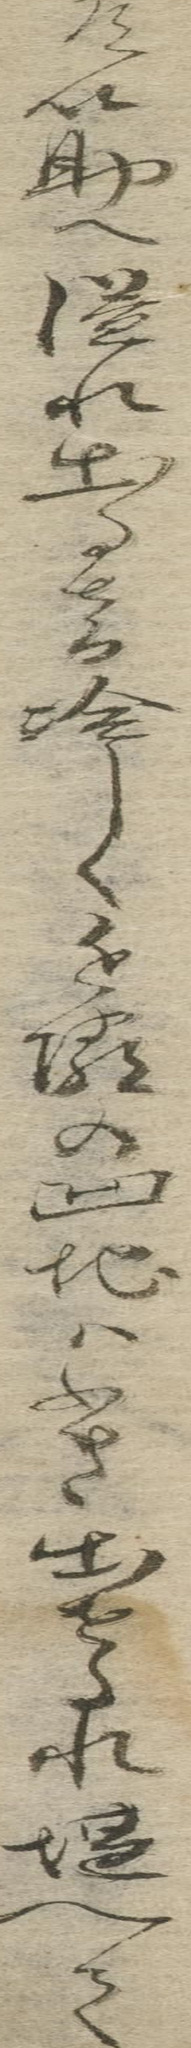道筋へ溢れ出る音冷しく近隣の凹地ハふき出せる水堪へて
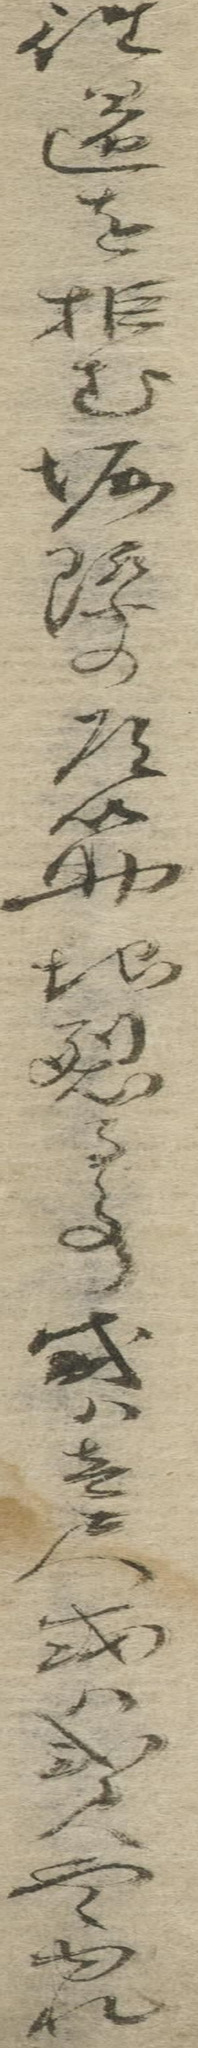往還を拒む堀際の道筋地裂る事或ハ壱尺或は弐尺やゝゆれ

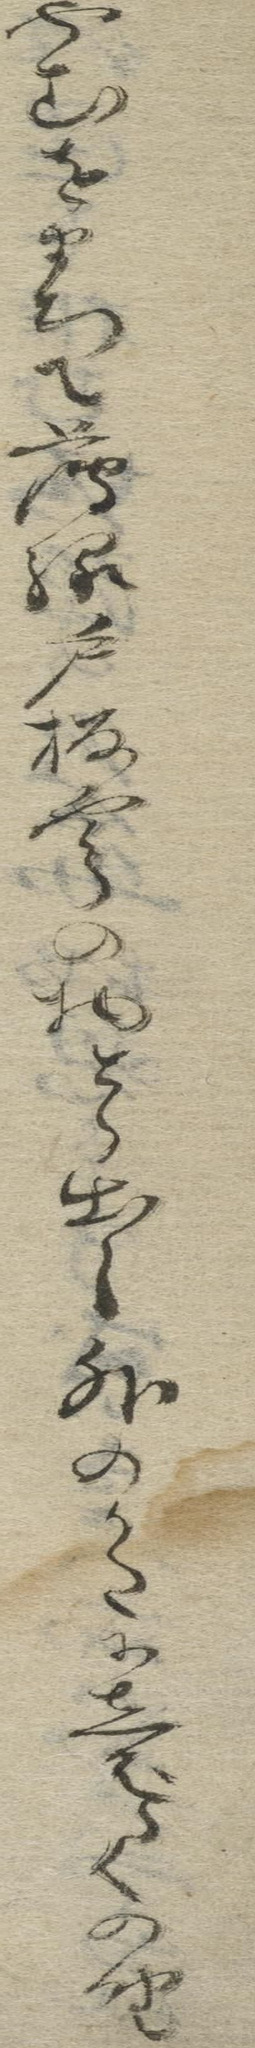やむをまちて薄縁戸板やらの物とり出し外のかたにしばらくの座
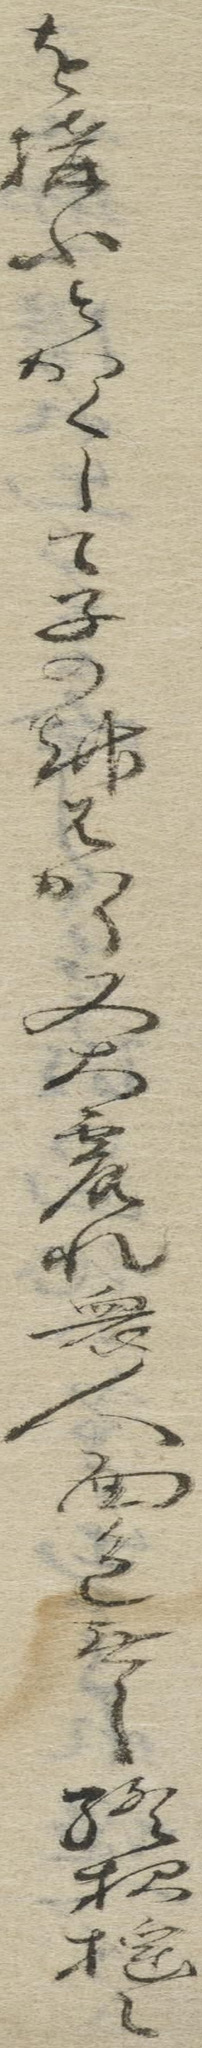を構ふとかくして子の刻はかり又大震れ衆人面色無之終夜揺し
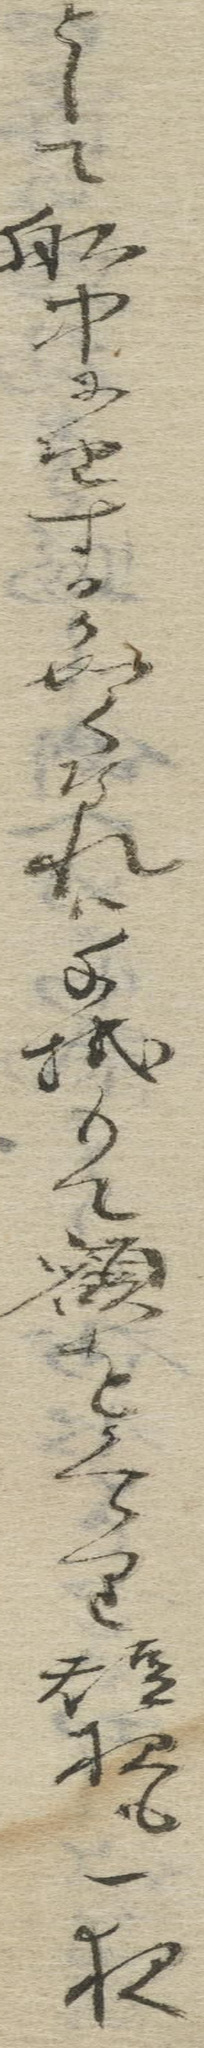として舩中に座するか如くなれハ手拭もて額をくゝり短夜も一夜
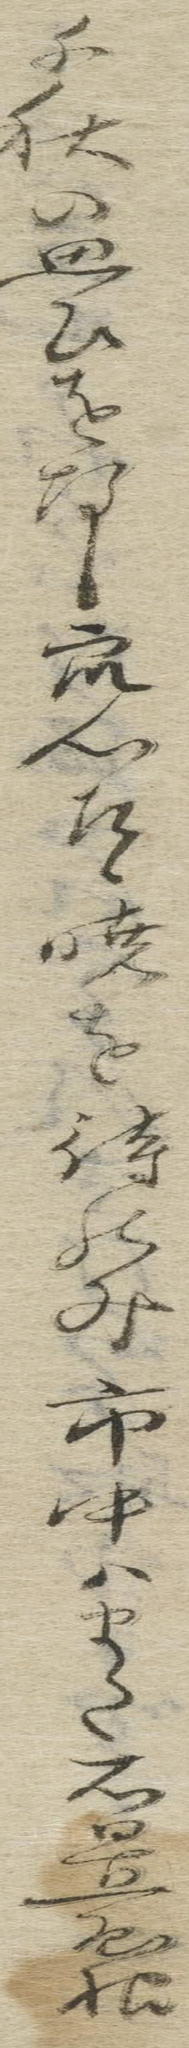千秋の思ひをなし衆心たゝ暁を待のみ市中ハまた石置屋根
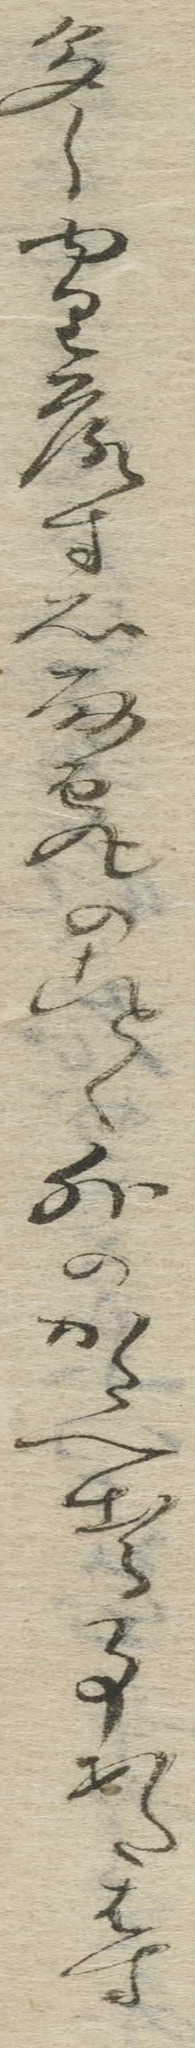多くゆり落す石雨霰のことく外のかたへ出る事あたはす
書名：弘化丁未天變日記
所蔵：東京大学地震研究所図書室 Earthquake Research Institute Library, The University of Tokyo, JAPAN
